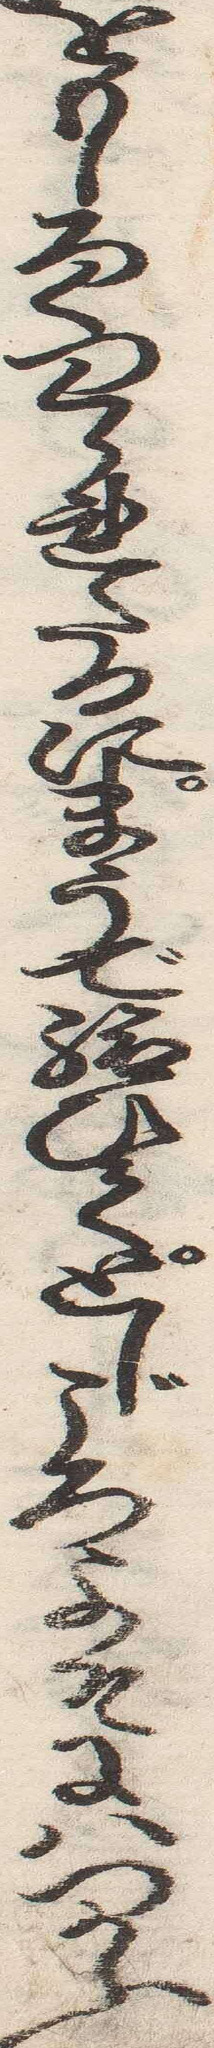をもしろくつくられたるに。まうで給ひて。としごろよそにはつかふ
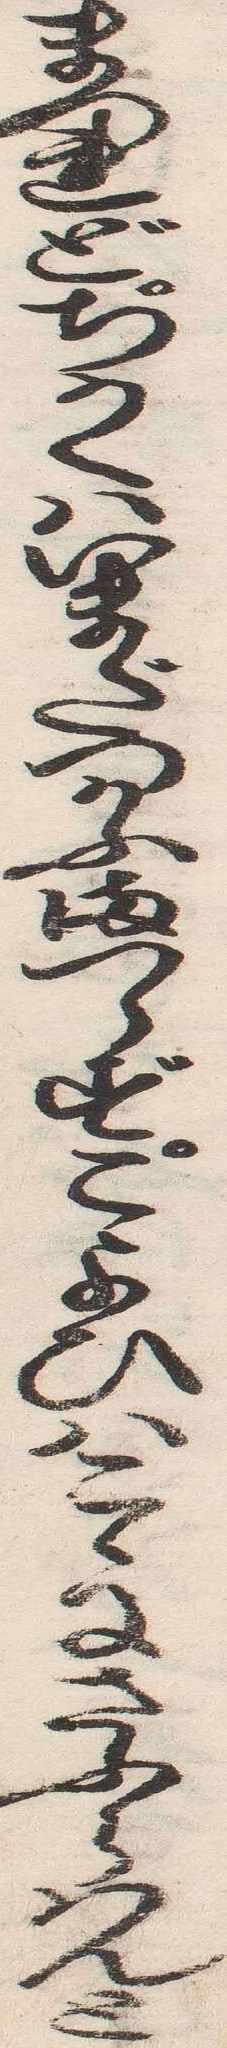まつれど。ちかくはいまだつかふまつらず。こよひはこゝにさふらはんと
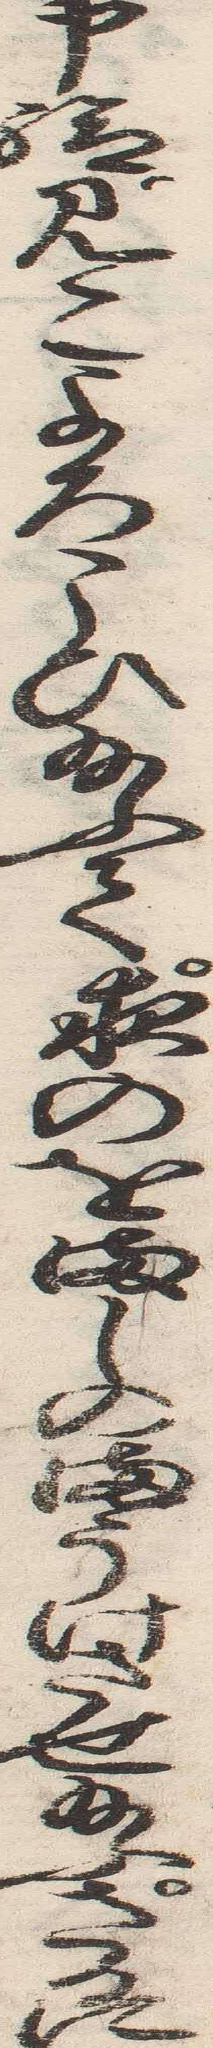申給。みこよろこひ給ふて。夜のをましのまうけさせ給ふ。さるに
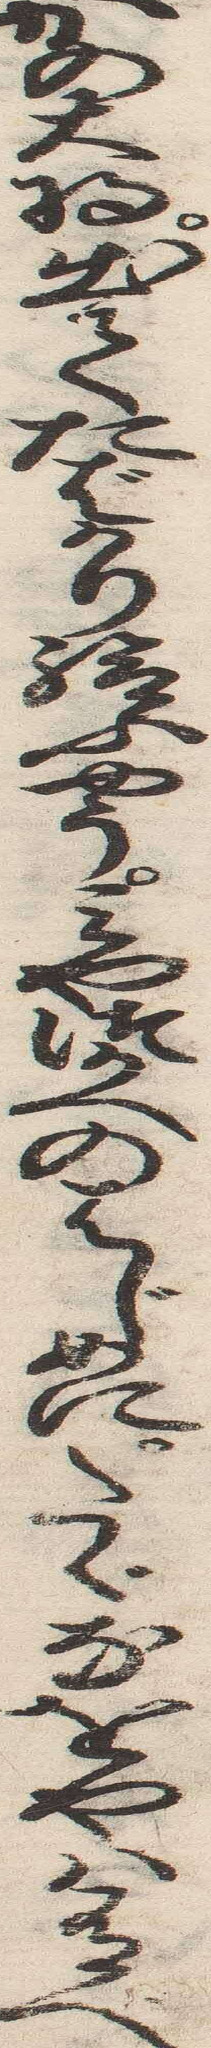かの大将。出てたばかり給ふやう。みやつかへのはじめに。たゞなをやは有へ

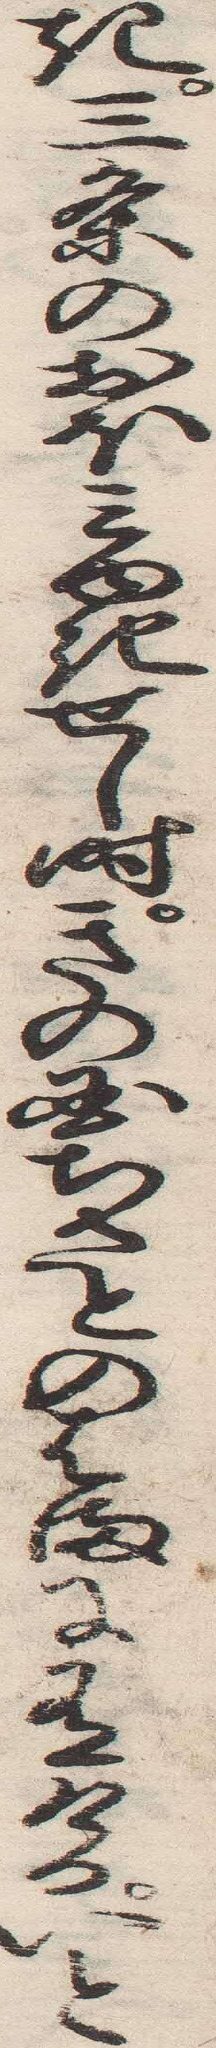き。三条のおほみゆきせし時。きの国ちさとのはまに有ける。いと
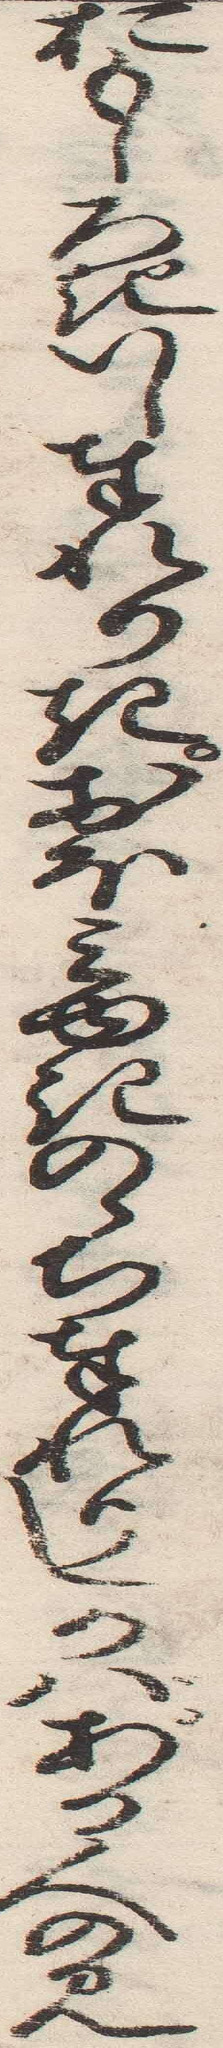おもしろきいし奉れりき。おほみゆきのゝち奉れりしかば。ある人のみ
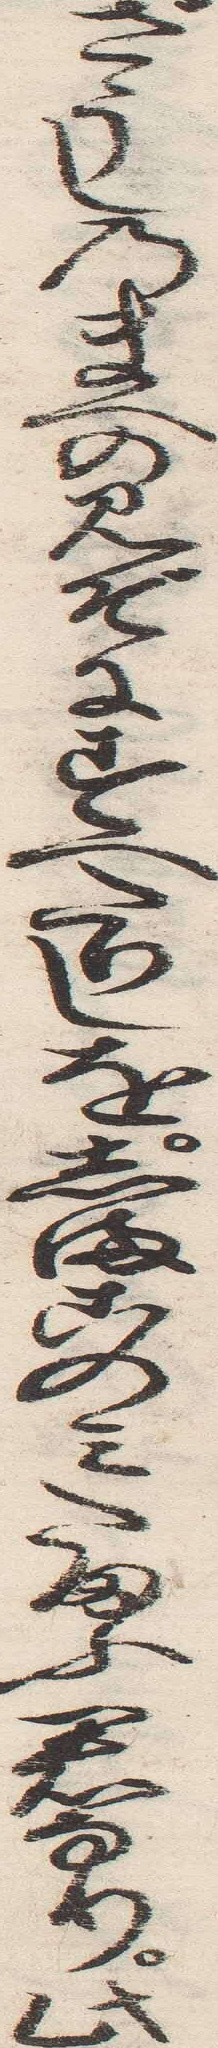ざうしのまへのみぞにすへたりしを。しまこのみたまふ君なり。此
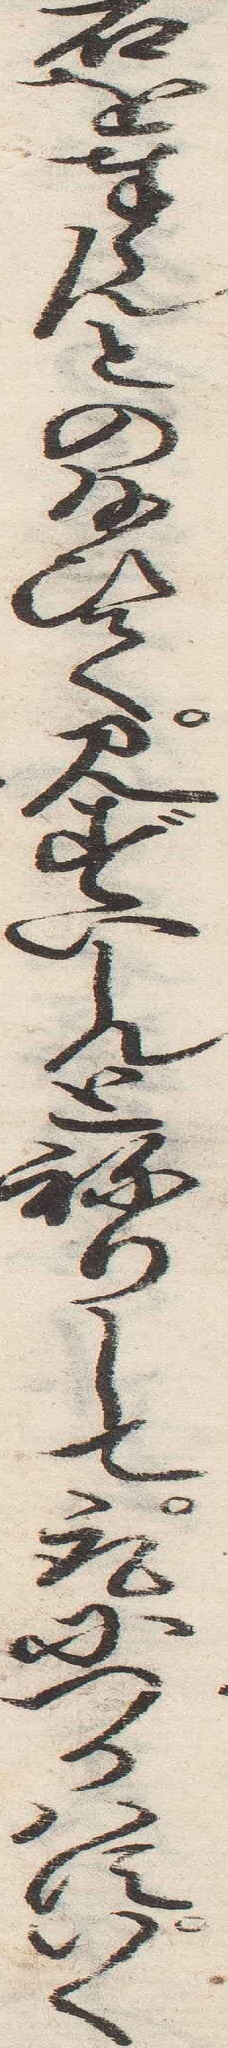石を奉らんとの給ひて。みずいしんとねりして。取につかはす。いく
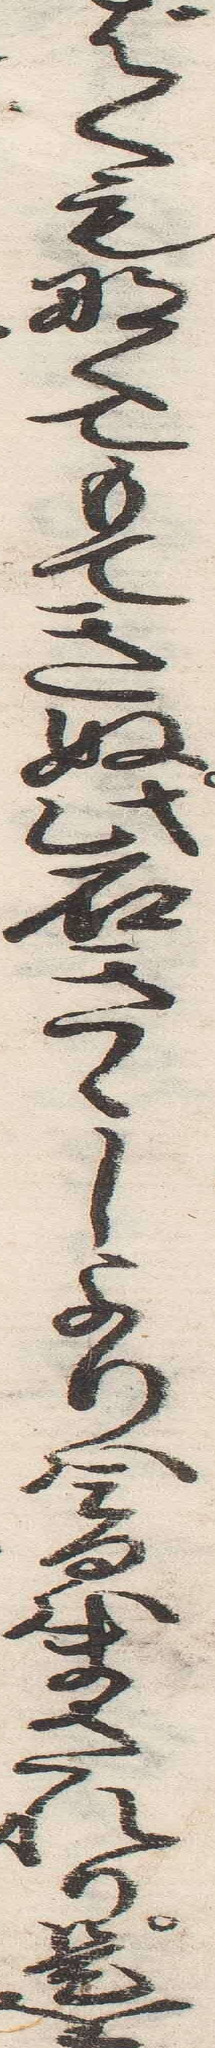ばくもなくてもてきぬ。此石きゝしよりはみるはまされり。是を
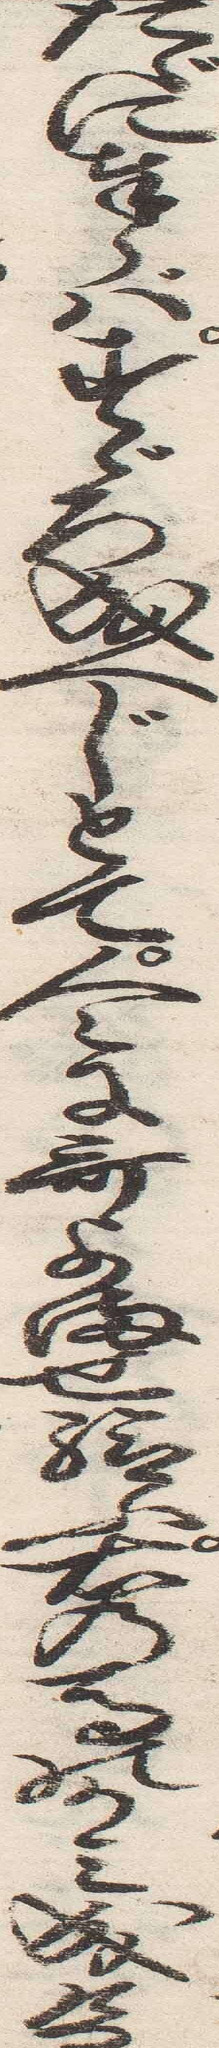たゞに奉らば。すゞろ成へじとて。人々に哥よませ給ふ。右の馬のかみ成ける
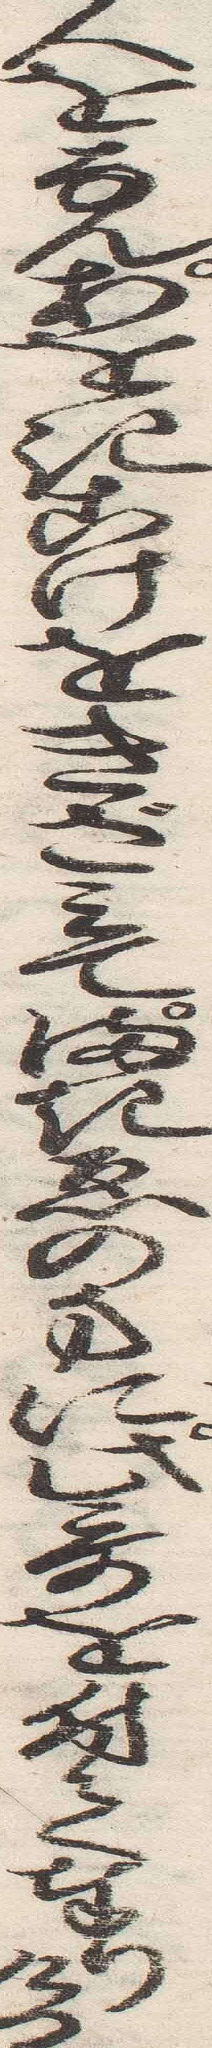人をなん。あをきこけをきざみて。まきゑの方に。此哥を付て奉りける
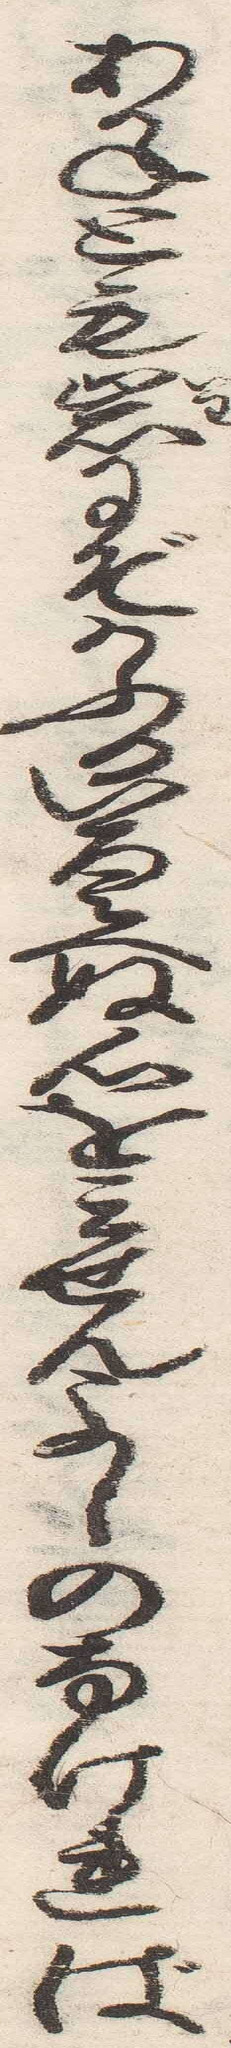あかねとも岩にぞかふるいろみへぬ心をみせんよしのなければ
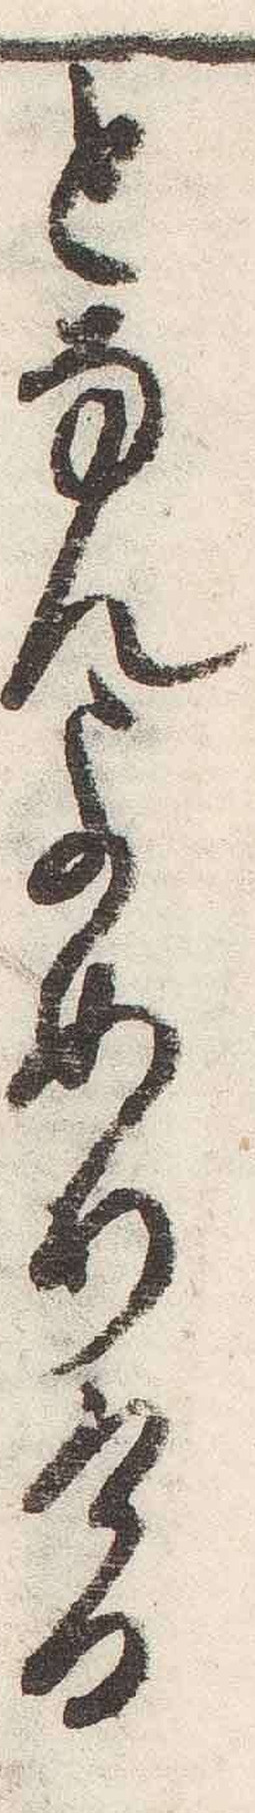となんよめりける
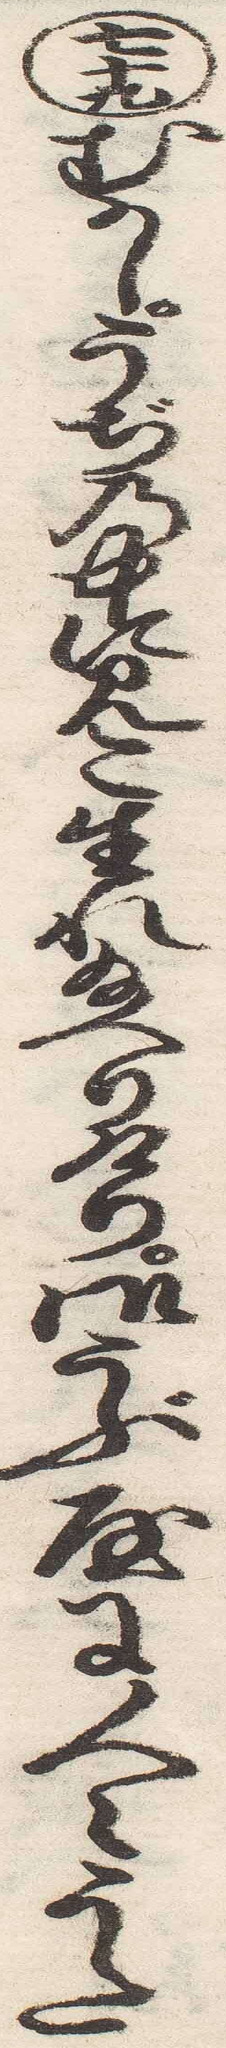七十九むかし。うぢの中にみこ生れ給へりけり。御うぶ屋に人々うた
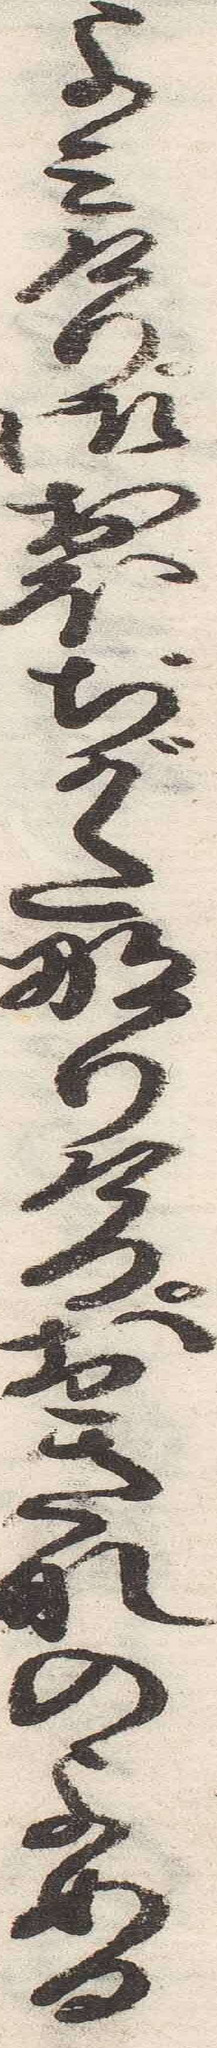よみけり。御おほぢがたなりける。おきなのよめる
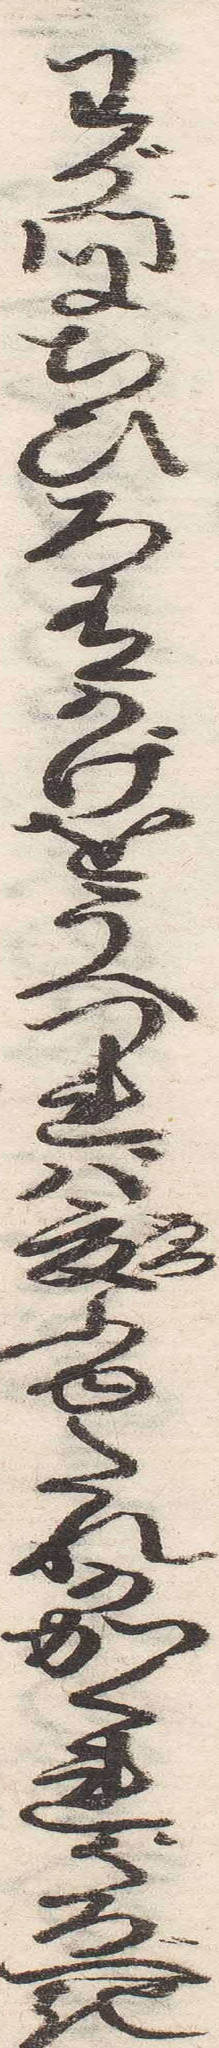わが門にちひろ有かげをうへつれば夏ふゆたれかかくれざるべき
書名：伊勢物語
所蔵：東京学芸大学附属図書館 国文学研究資料館
